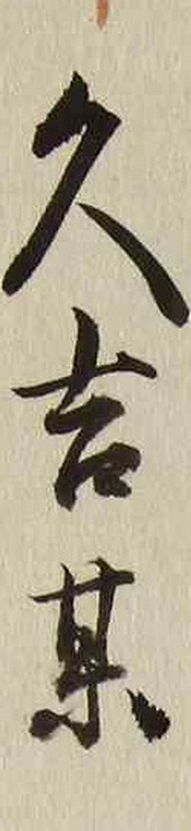久吉某
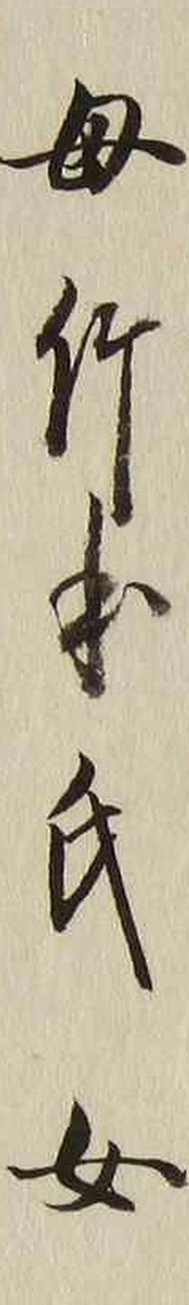母竹本氏女
